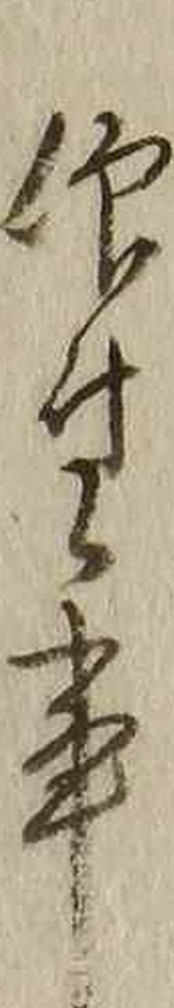仰付候事
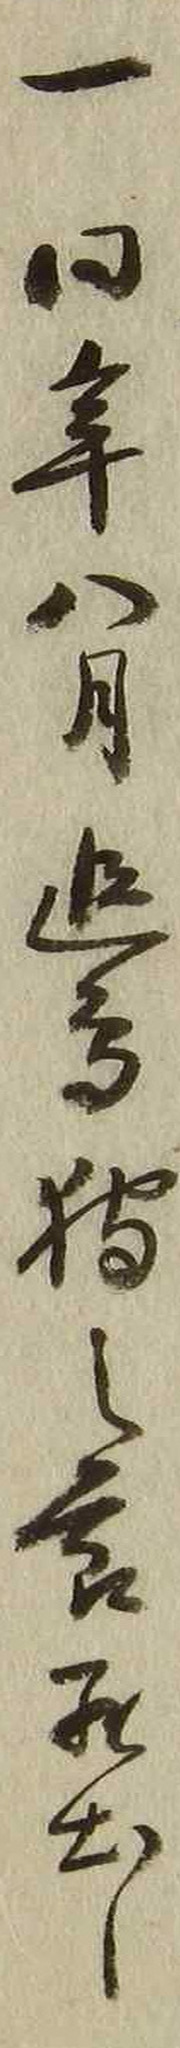一同年八月追鳥狩之節罷出候
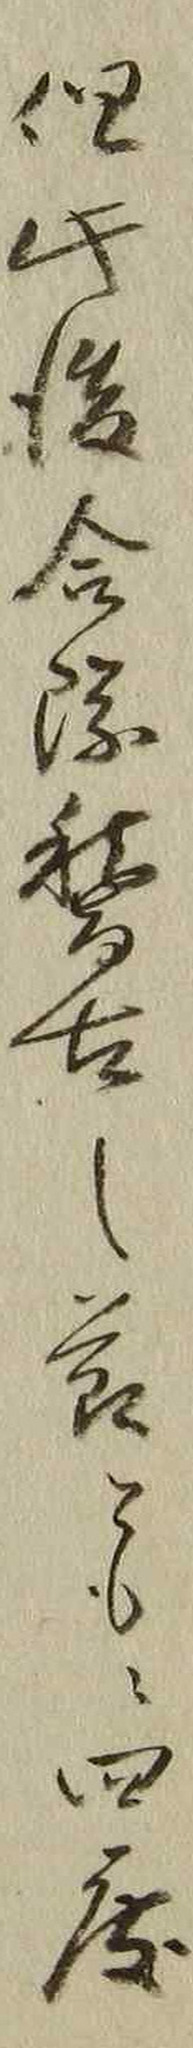但此後合隊稽古之節ともニ四度
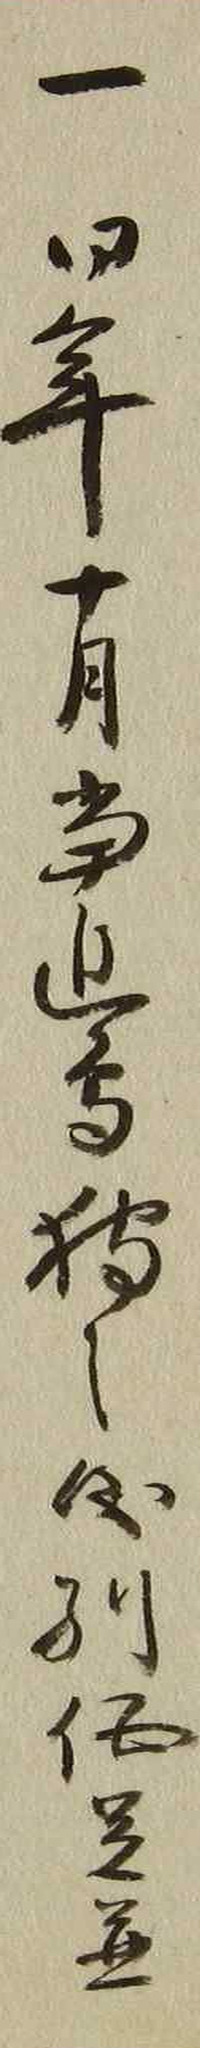一同年十月当追鳥狩之儀列伍足並
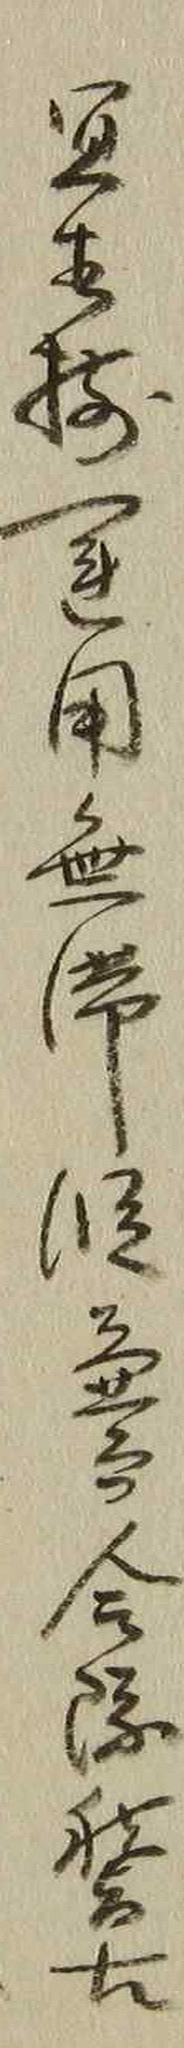宜相揃運用無滞段兼而合隊稽古
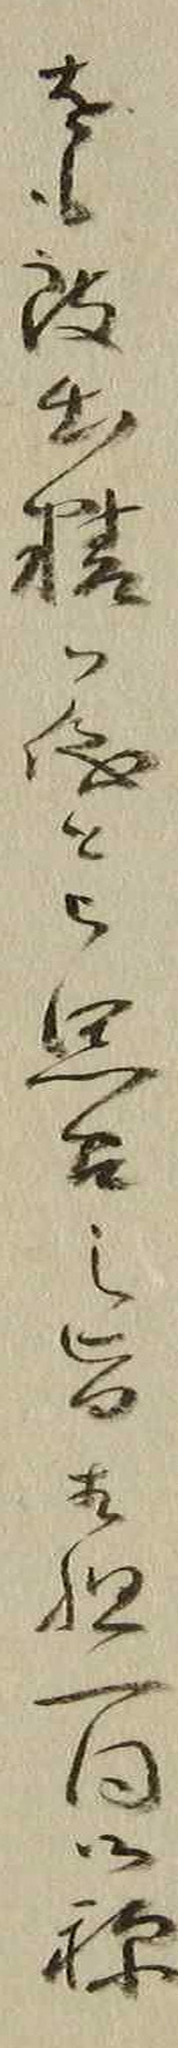をも致出精候儀と被思召之旨相組一同御称
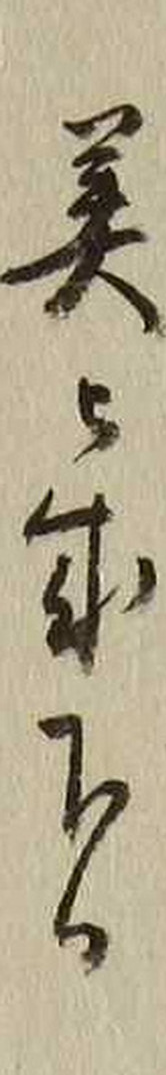美被成下候
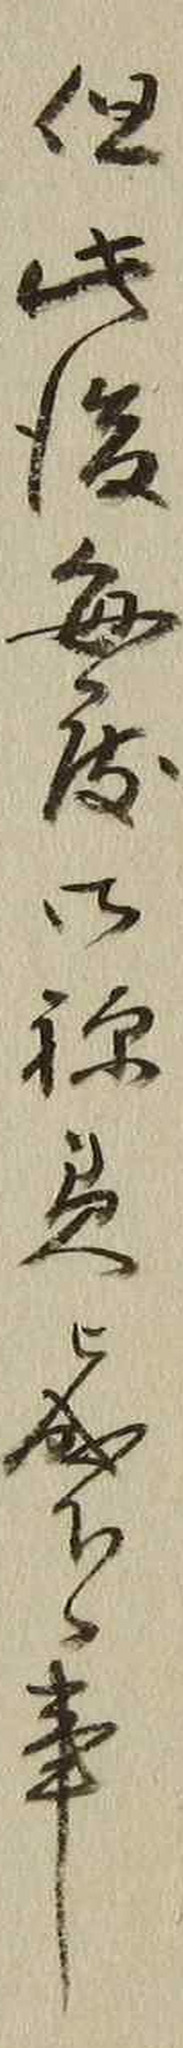但此後毎度御称美被成下候事
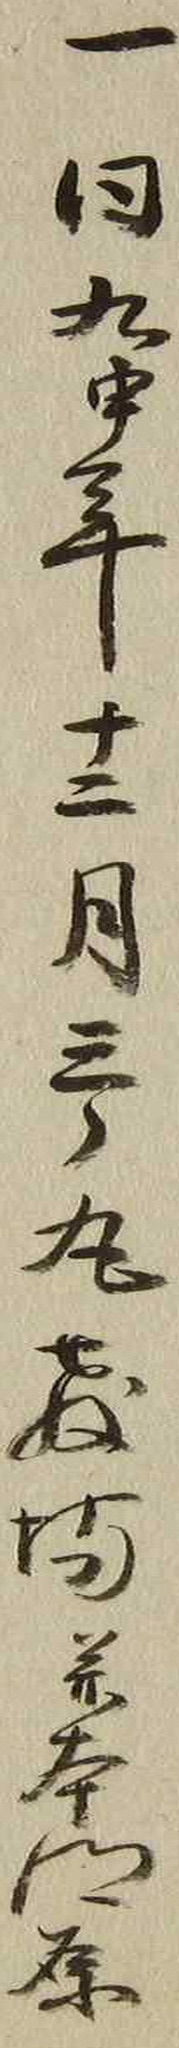一同九申年十二月三ノ丸教場并本郷原
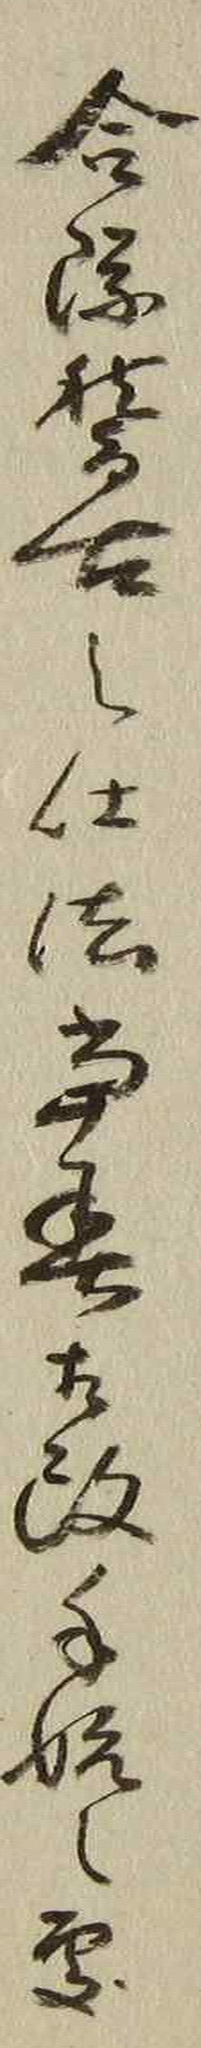合隊稽古之仕法当春相改手始之処
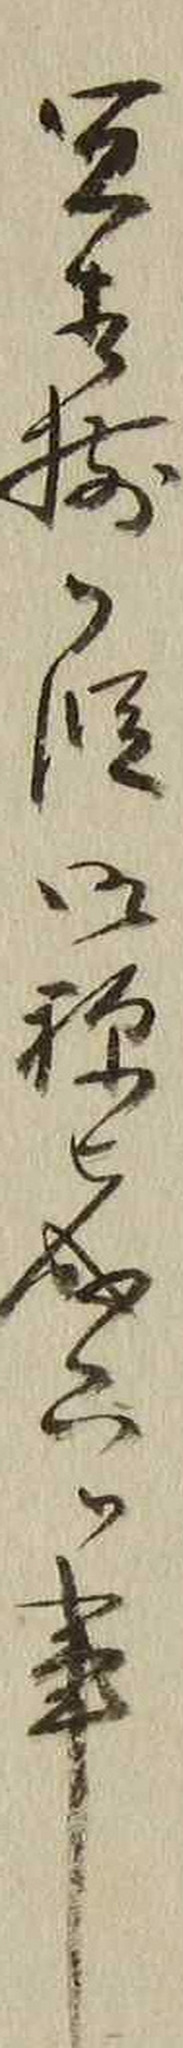宜相揃候段御称被成下候事
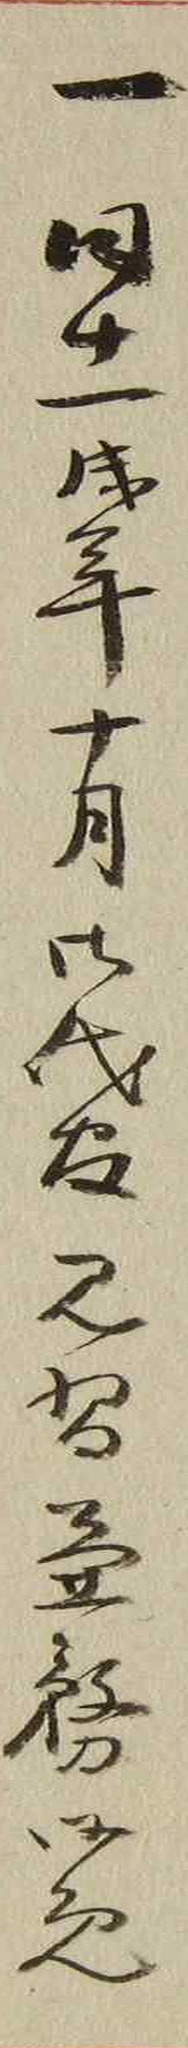一同十一戌年十月御代官見習兼務御免
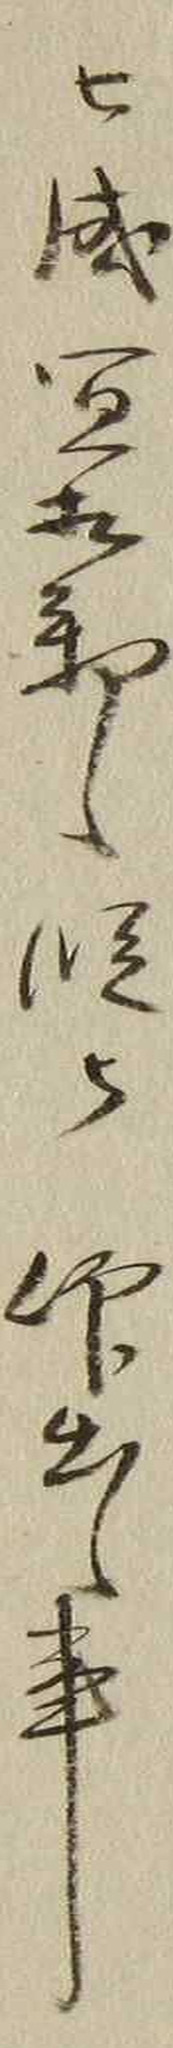被成宜相勤候段被仰出候事
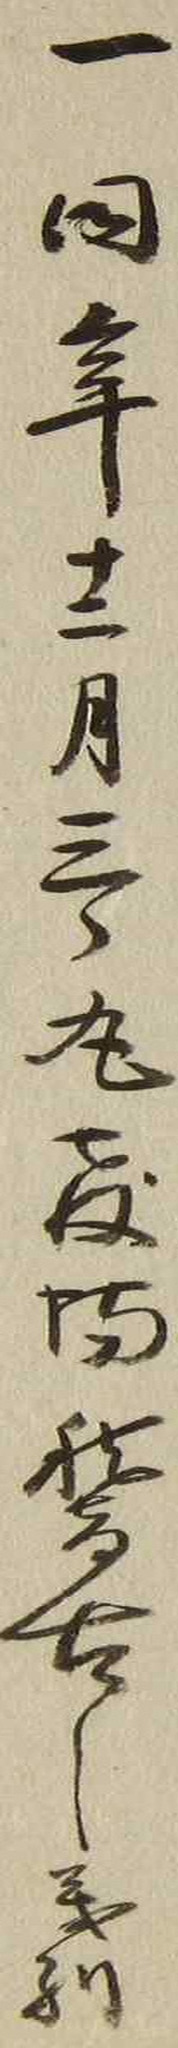一同年十二月三ノ丸教場稽古之義列
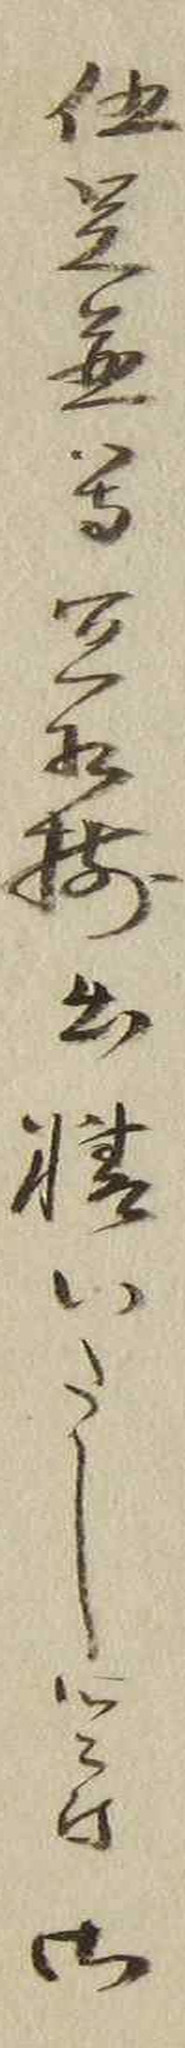伍足並等宜相揃出精いたし候ニ付御
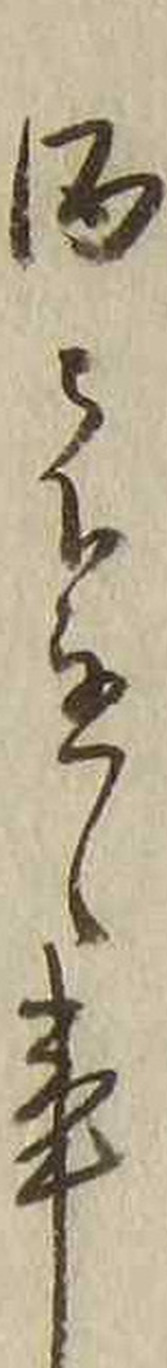酒被下置候事
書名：諸士系譜　巻之236　ふ之部4
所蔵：会津若松市立会津図書館
